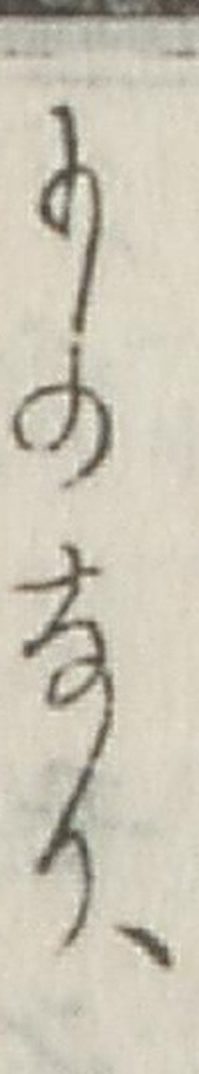ものなり、
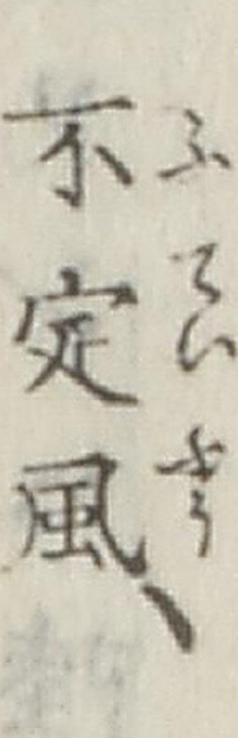不定風、
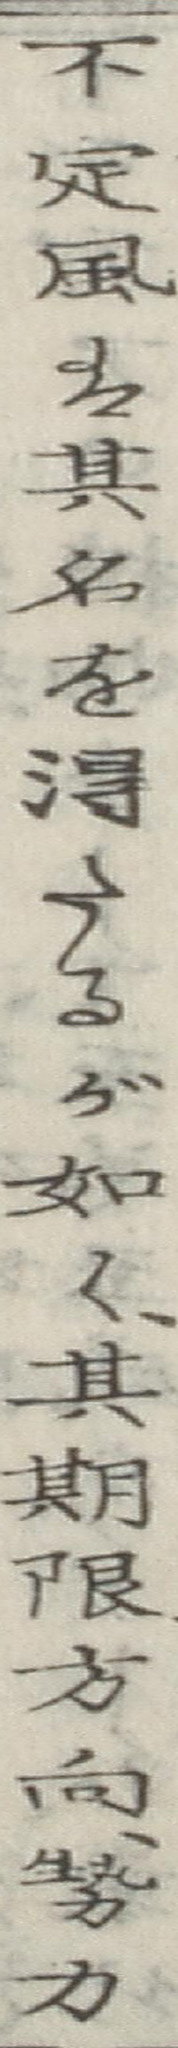不定風は其名を得たるが如く、其期限、方向、勢力
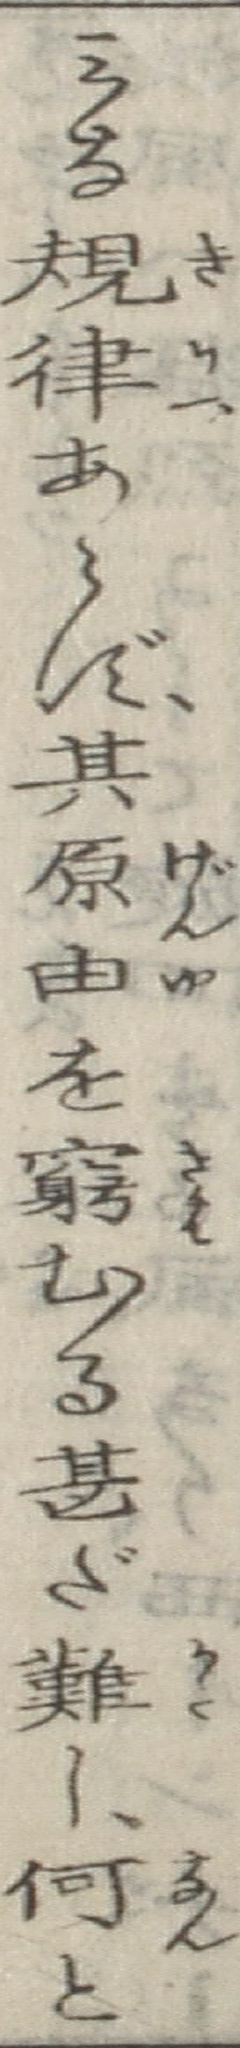みな規律あらず、其原由を窮むる甚だ難し、何と
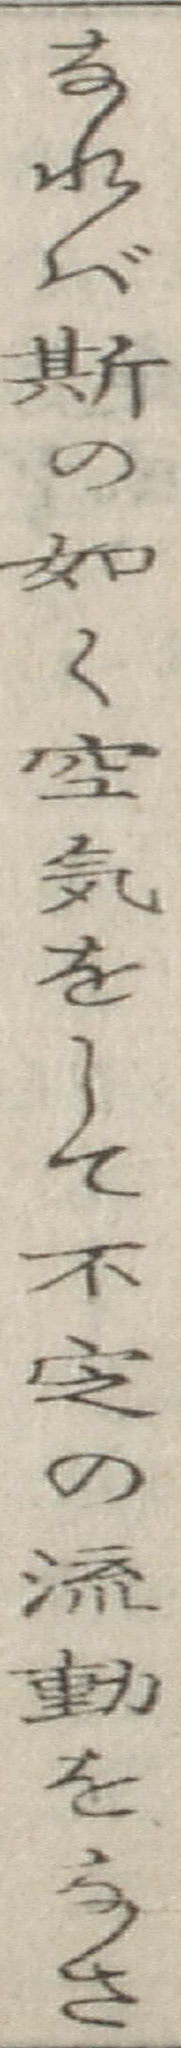なれば斯の如く空気をして不定の流動をなさ
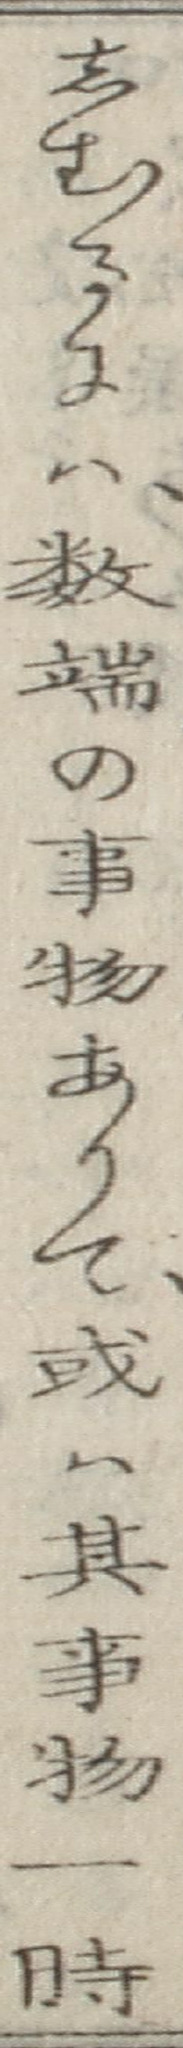しむるには、数端の事物ありて、或は其事物一時
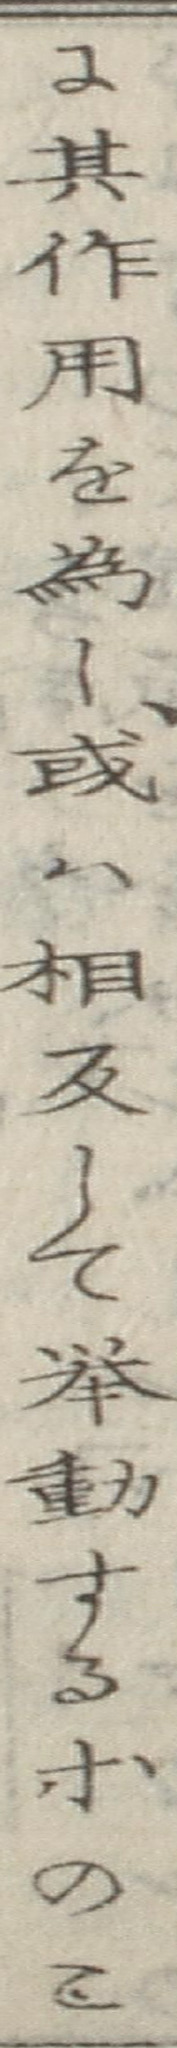に其作用を為し、或は相反して挙動する等のこ
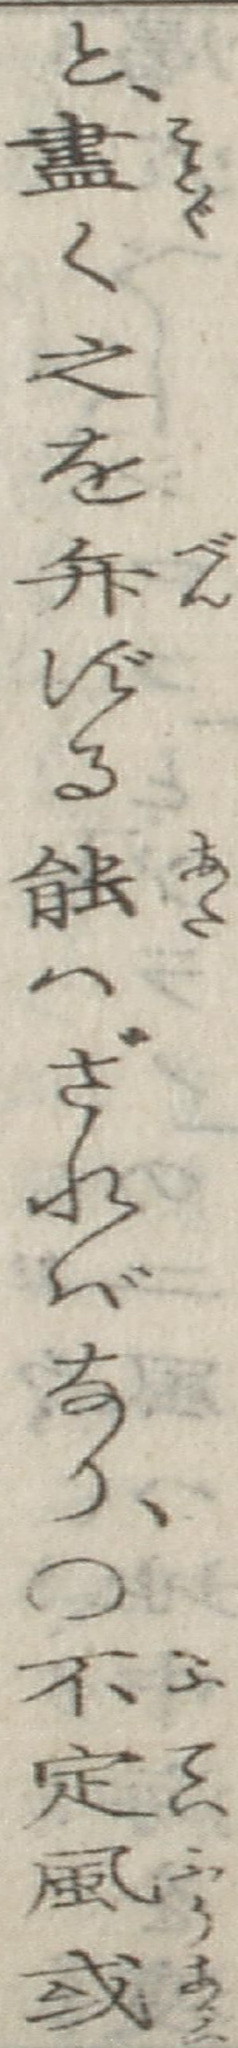と、盡く之を弁ずる能はざればなり、〇不定風或
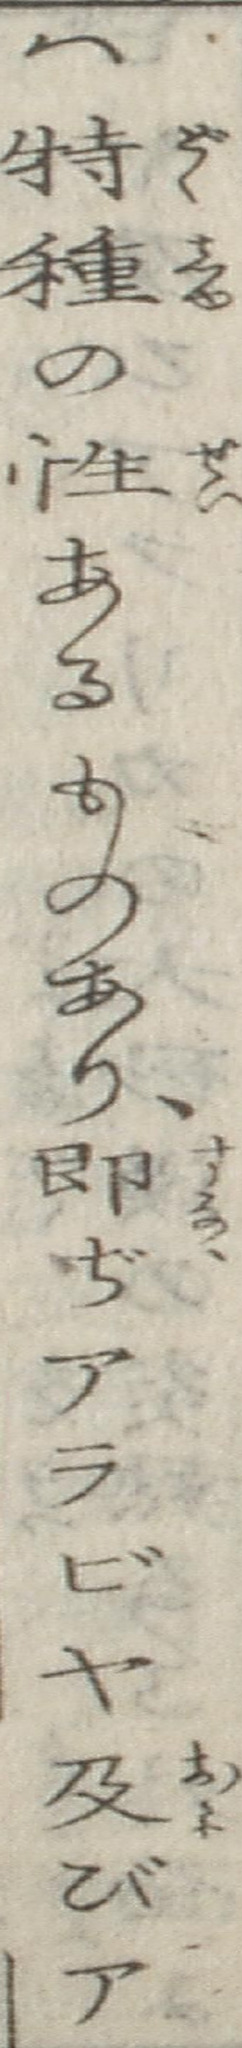は特種の性あるものあり、即ぢアラビヤ及びア
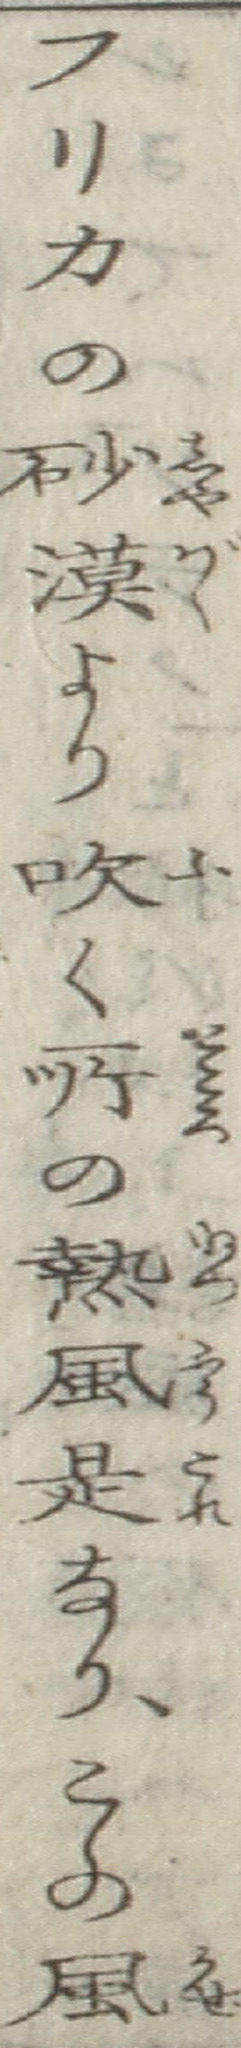フリカの砂漠より吹く所の熱風是なり、この風
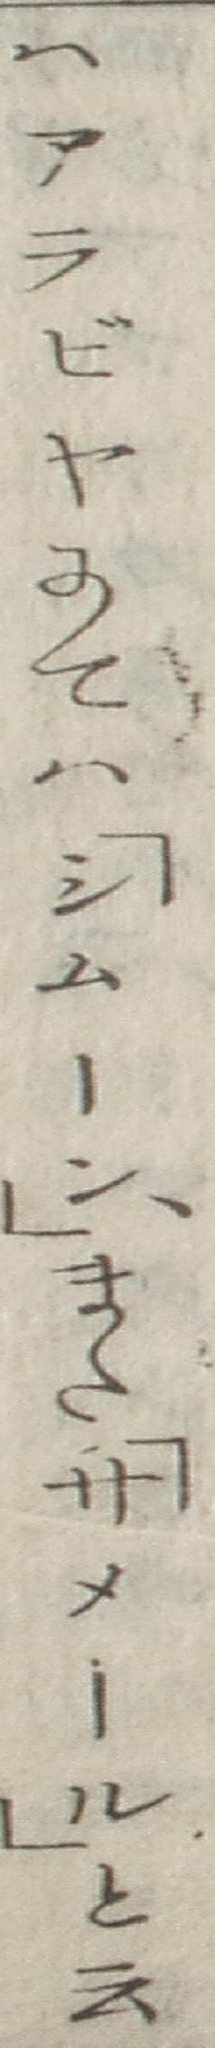はアラビヤにては「シムーン、」また「サメール」と云
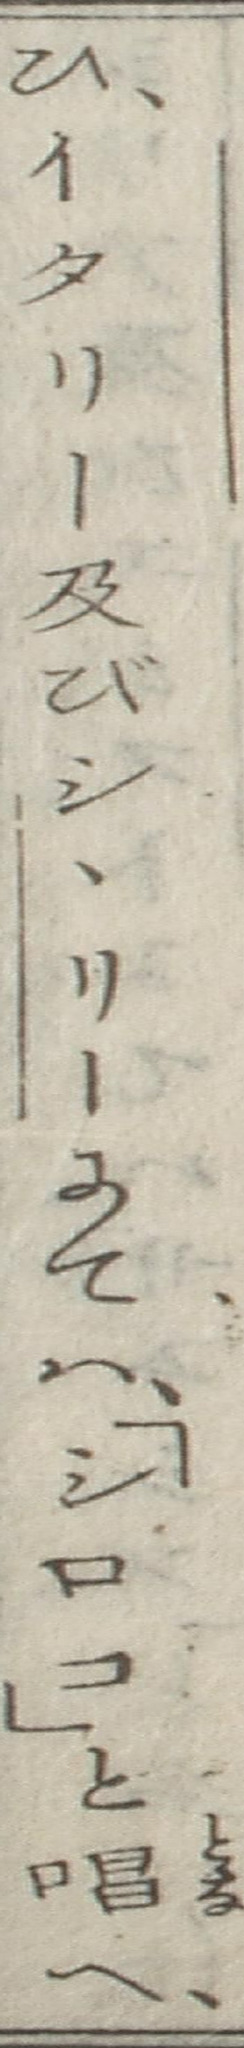ひ、イタリー及びシゝリーにては、「シロコ」と唱へ、

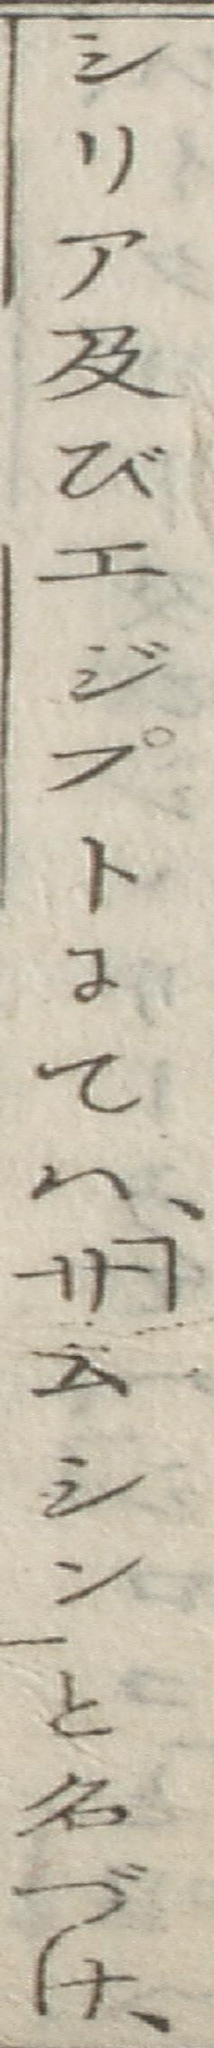シリア及びエジプトにては、「サムシン」と名づけ、
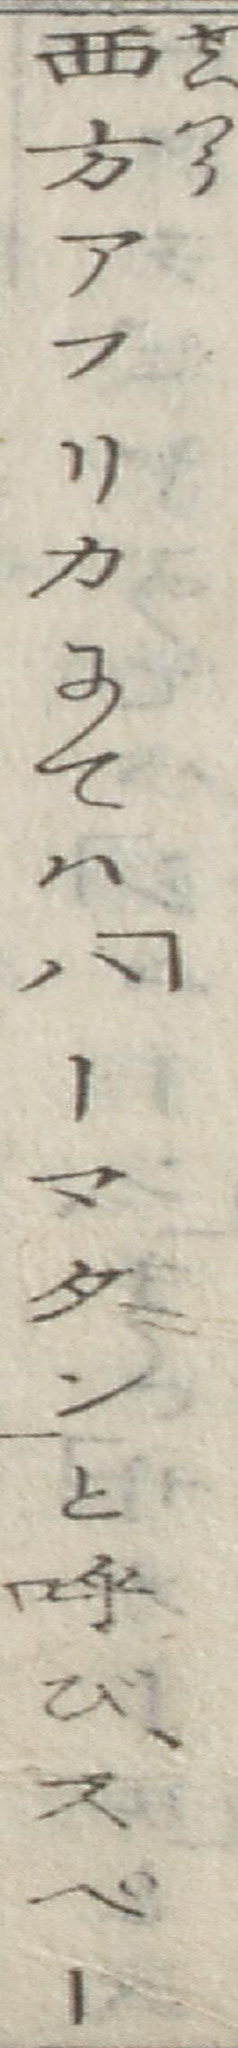西方アフリカにては「ハーマタン」と呼び、スペー
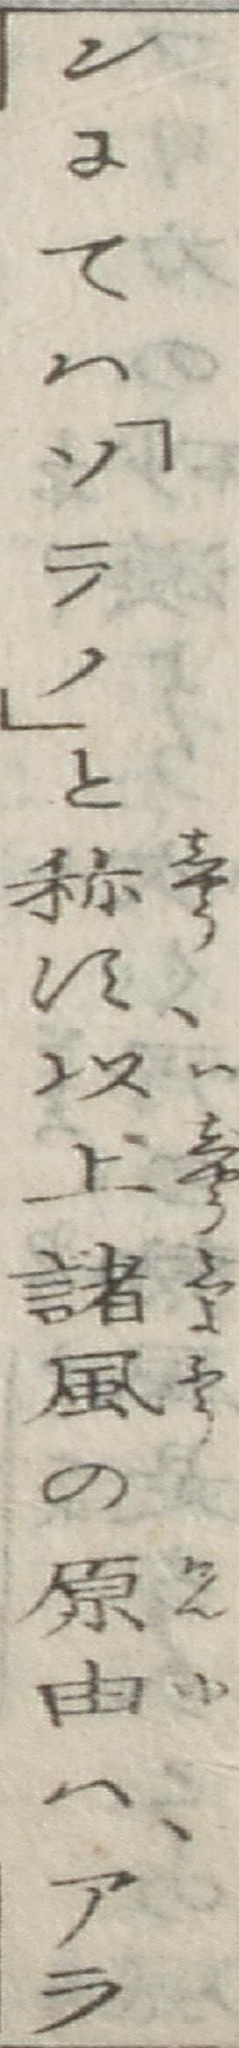ンにては「ソラノ」と称す、以上諸風の原由は、アラ
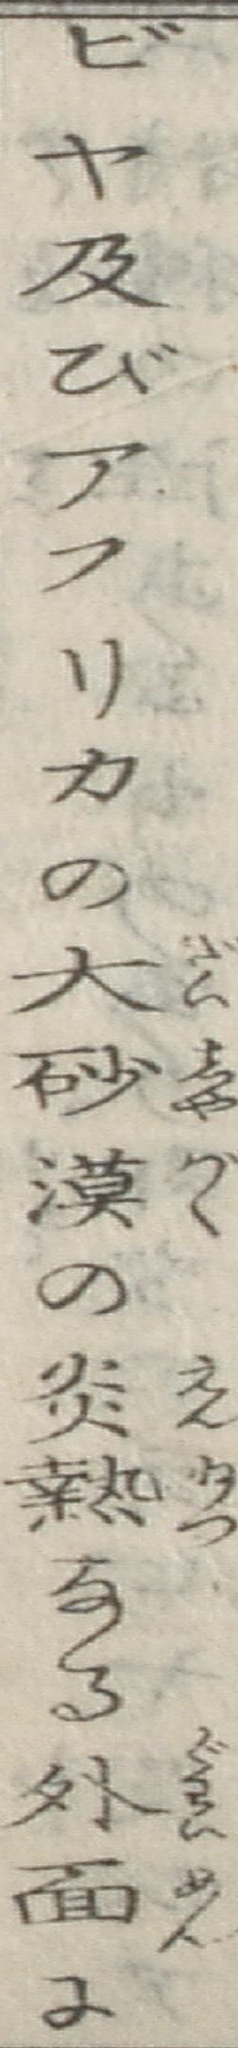ビヤ及びアフリカの大砂漠の炎熱なる外面に
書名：訓蒙　天然地理學　中
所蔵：東京大学地震研究所図書室 Earthquake Research Institute Library, The University of Tokyo, JAPAN
